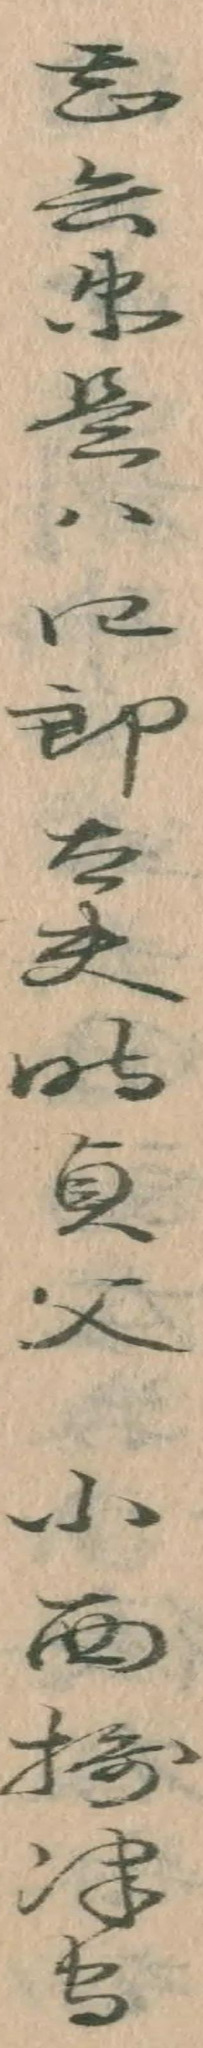甚兵衛是は四郎太夫時貞父小西摂津守
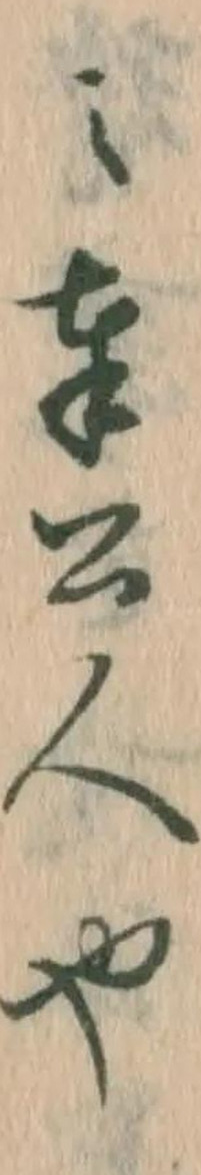之奉公人也
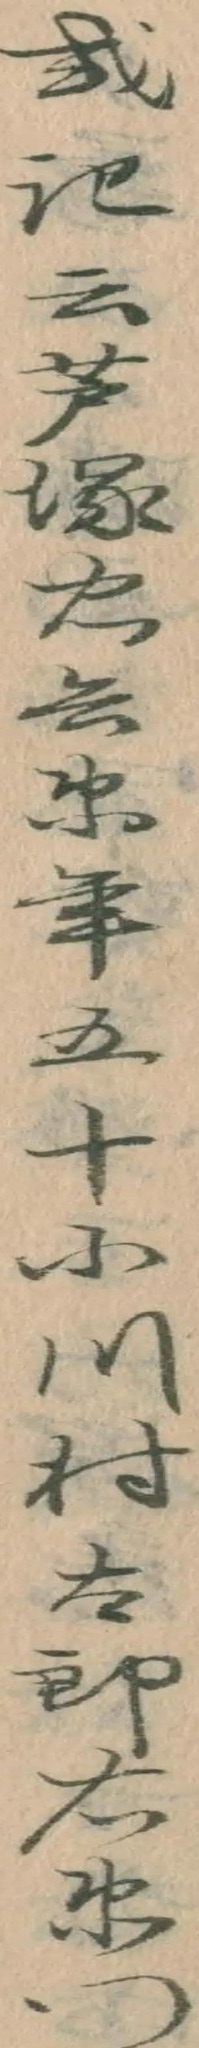或記云芦塚忠兵衛年五十小川村太郎右衛門
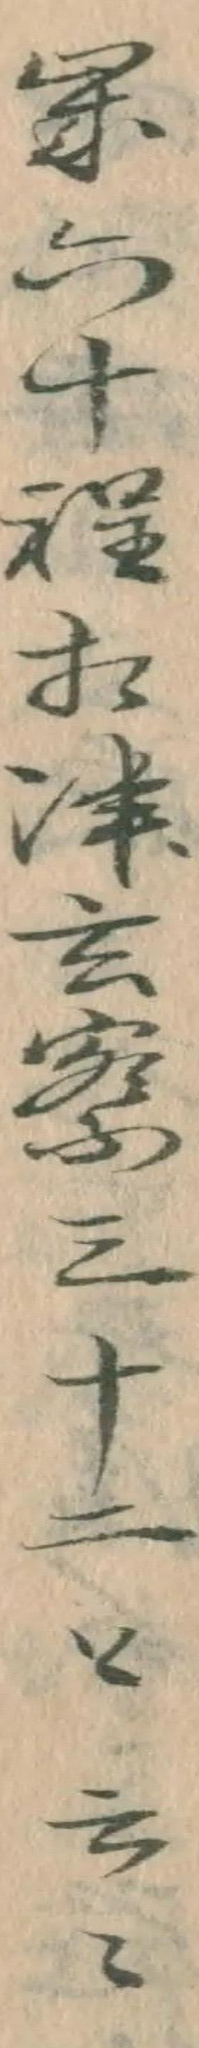歳六十程相津玄察三十二と云々
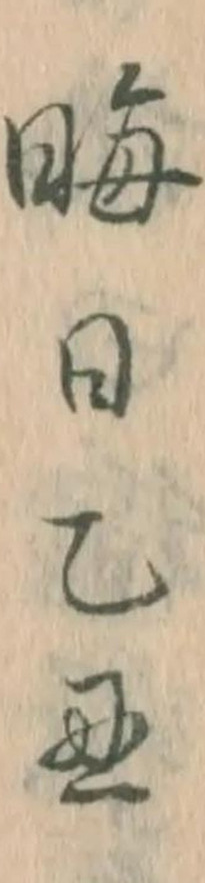晦日乙丑

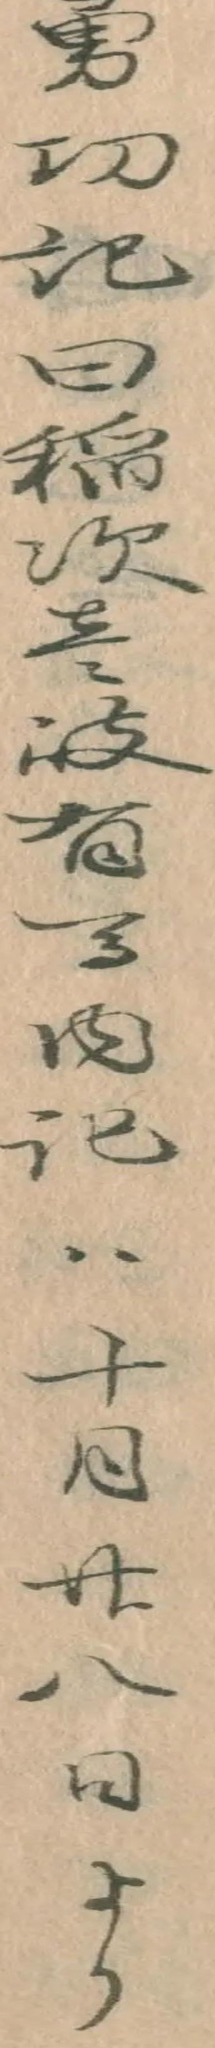勇功記曰稲次壱岐有馬内記は十月廿八日より
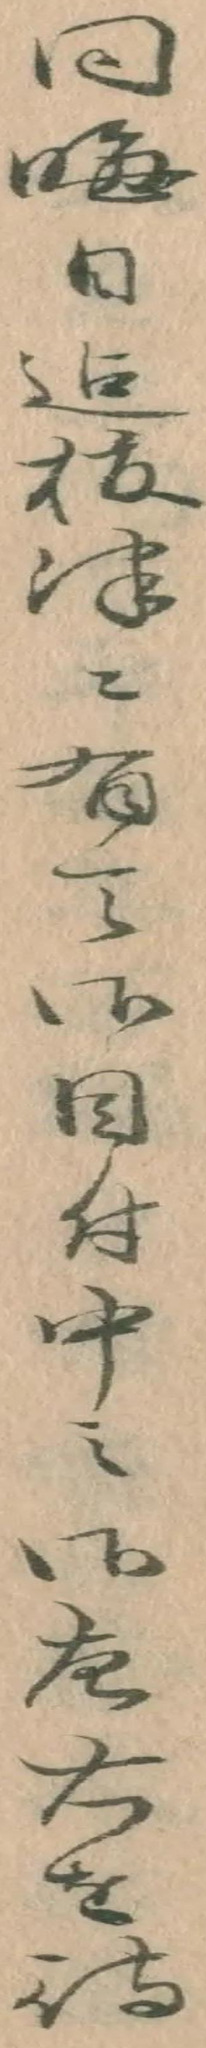同晦日迄抜津に有馬御目付中之御左右を侍
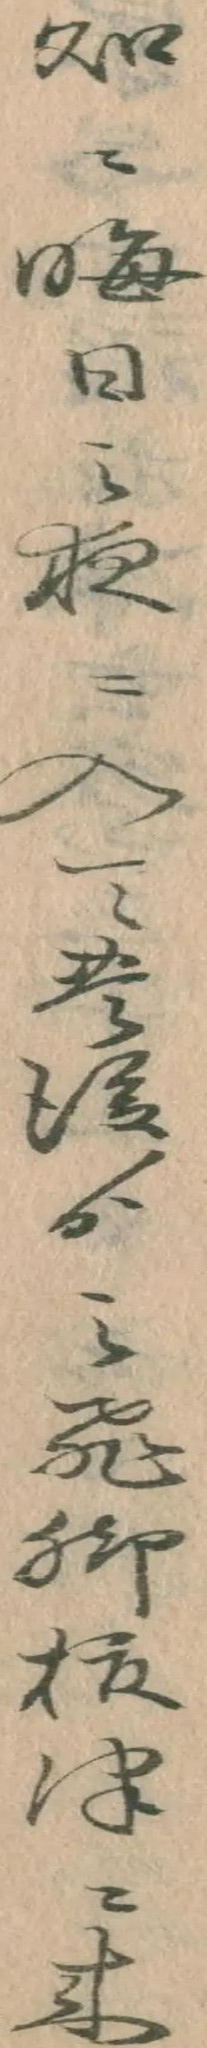処に晦日之夜に入て豊後ゟ之飛脚抜津に来
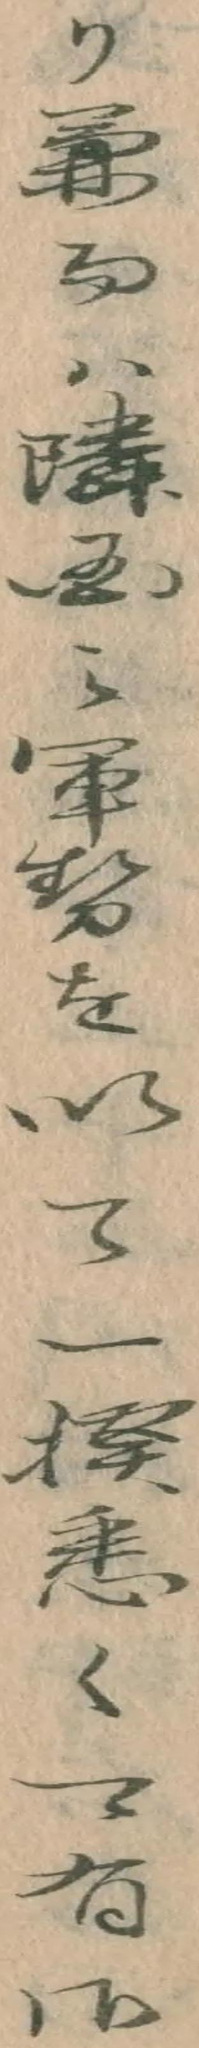り兼而は隣国之軍勢を以て一揆悉く可有御
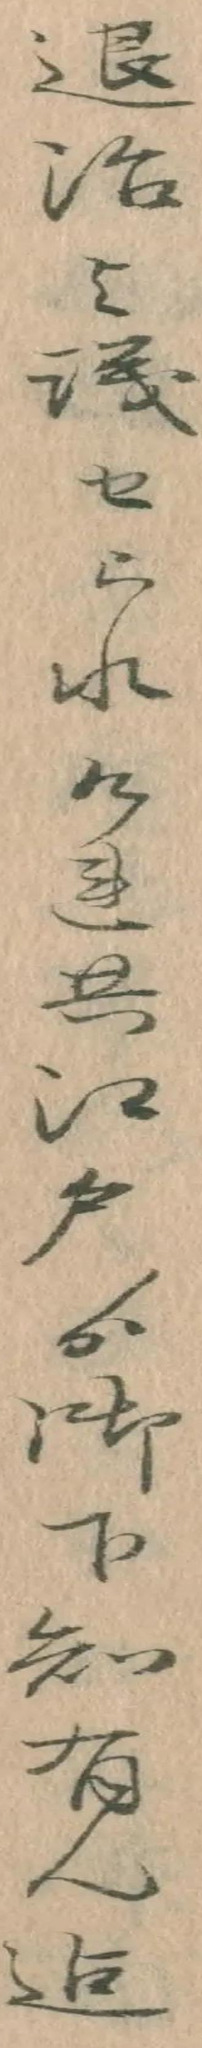退治与議せられけ連共江戸ゟ御下知有ん迄
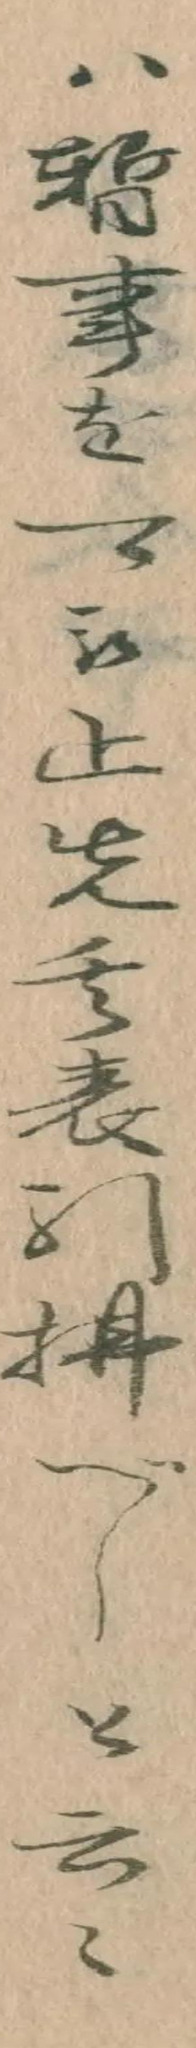は暫事を可被止先其表引払へしと云々
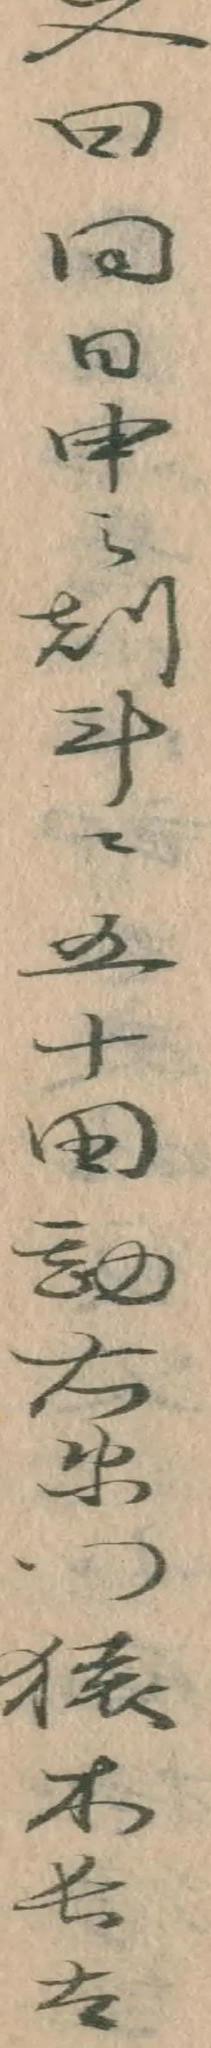又曰同日申之刻斗に五十田勘右衛門猿木長太
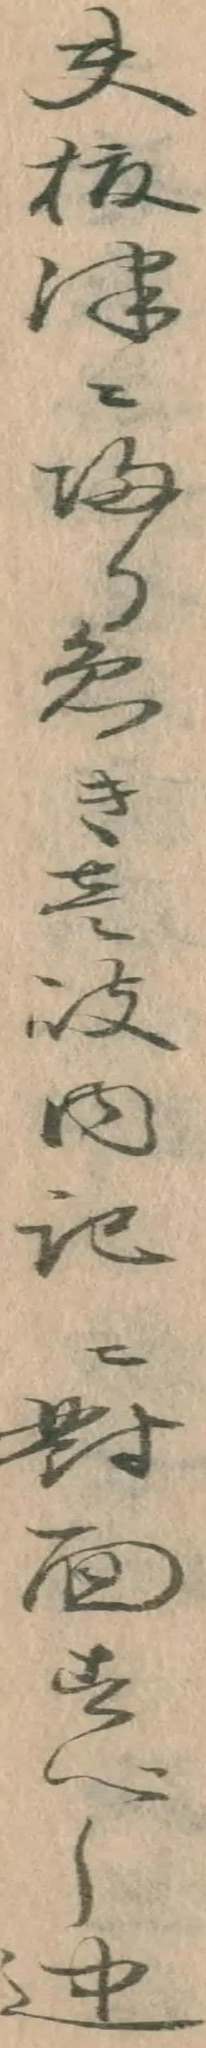夫抜津に帰り急き壱岐内記に対面春べし迚
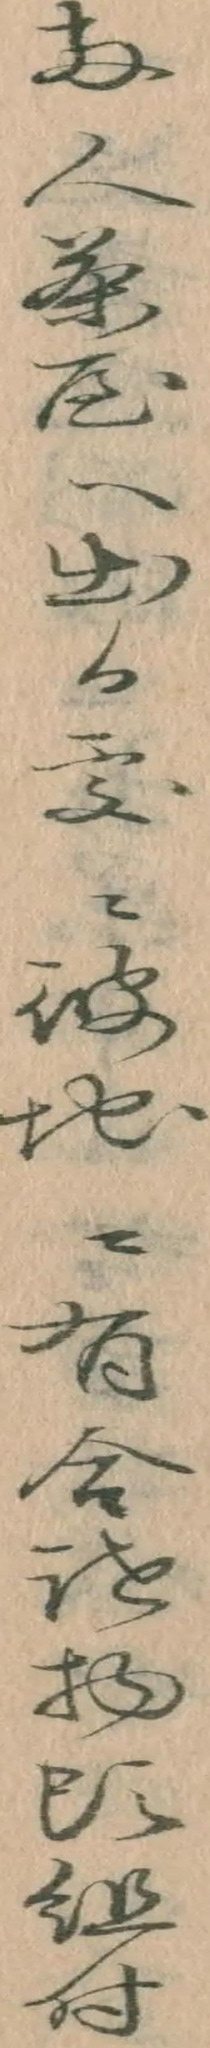両人茶屋へ出る処に彼地に有合諸物頭組付
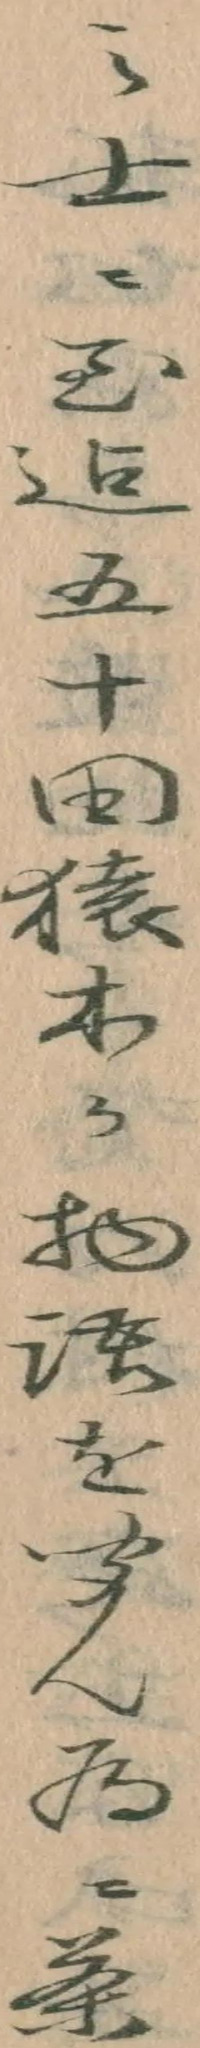之士に至迄五十田猿木か物語を聞ん為に茶
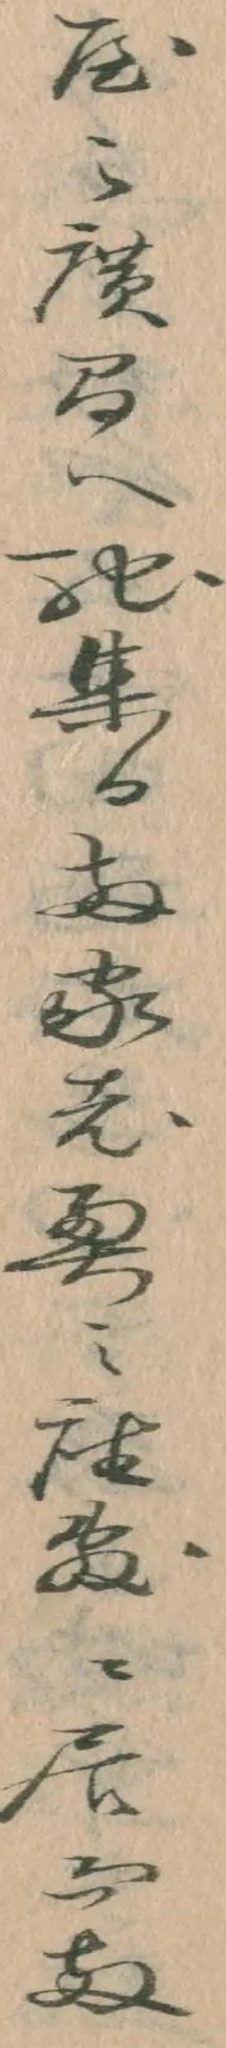屋之広間へ馳集る両家老奥之座敷に居而両
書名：切支丹御退治記 49巻. [2]
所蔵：国立国会図書館 National Diet Library, JAPAN
